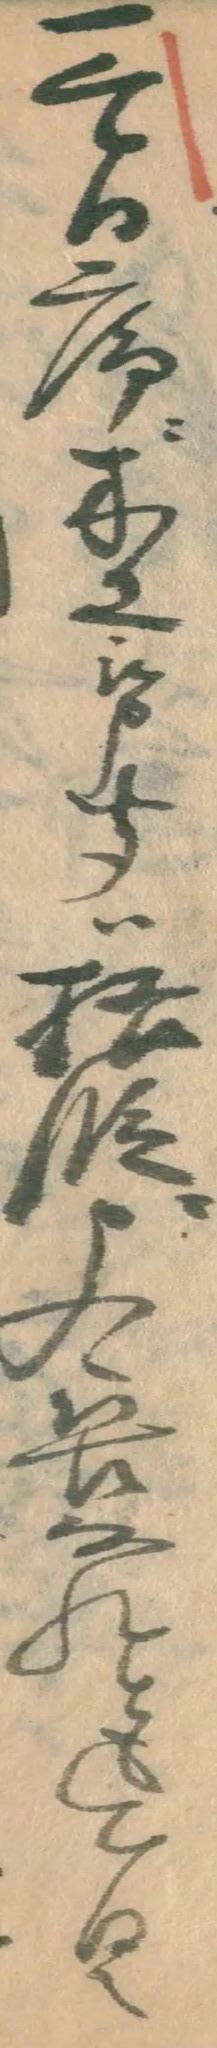一今日序ニ木工被申聞ハ格段ニ申入候筈なれとも今日之
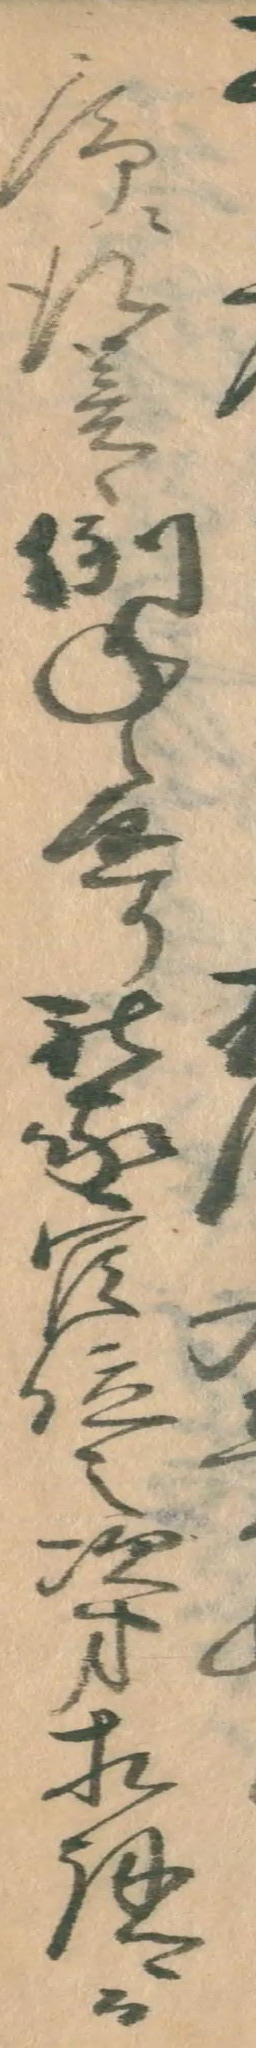序ニ得御意候例年之通り社家官位之次第相認候而

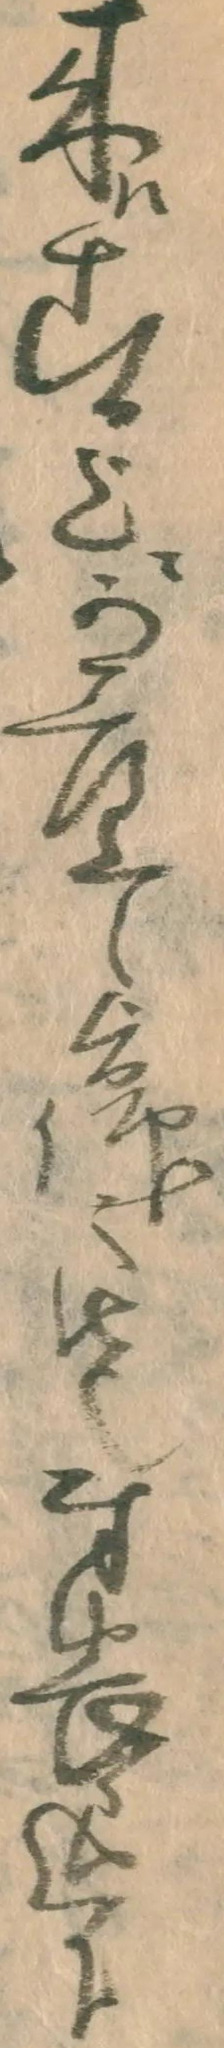来ル十八日迄ニ可差上之旨仰之由申候奉畏退下
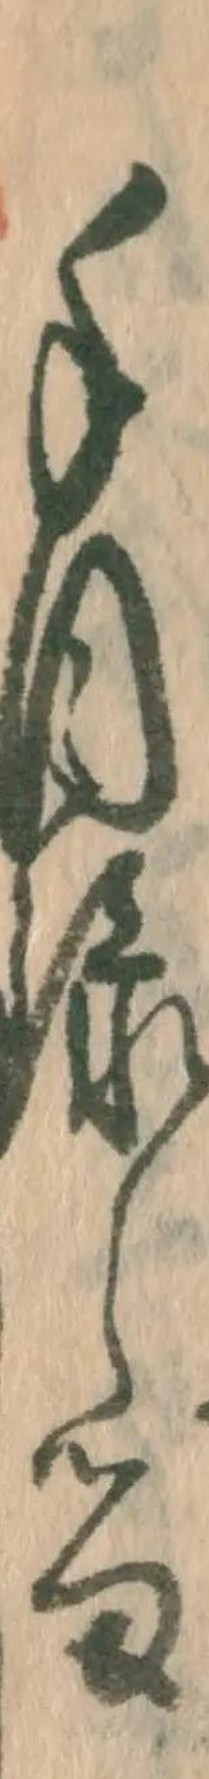手目録之留
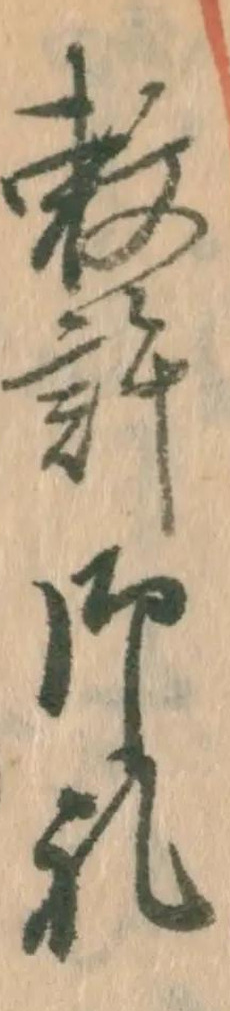勅許御礼
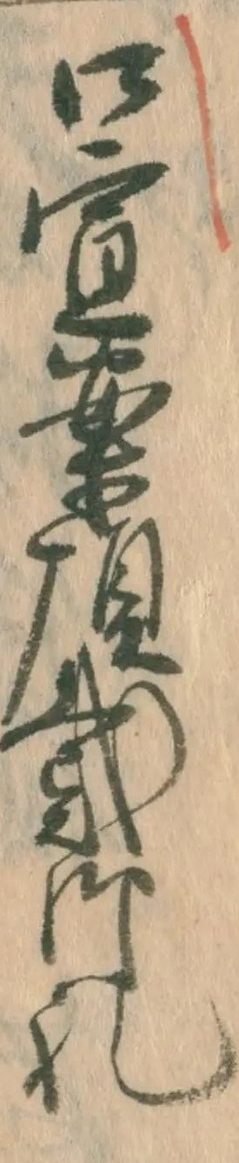口宣案頂戴御礼
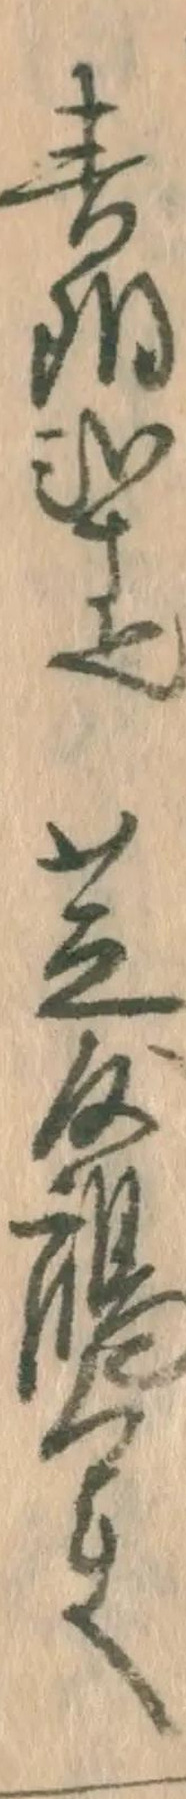青銀弐十疋芝屋鶴太夫
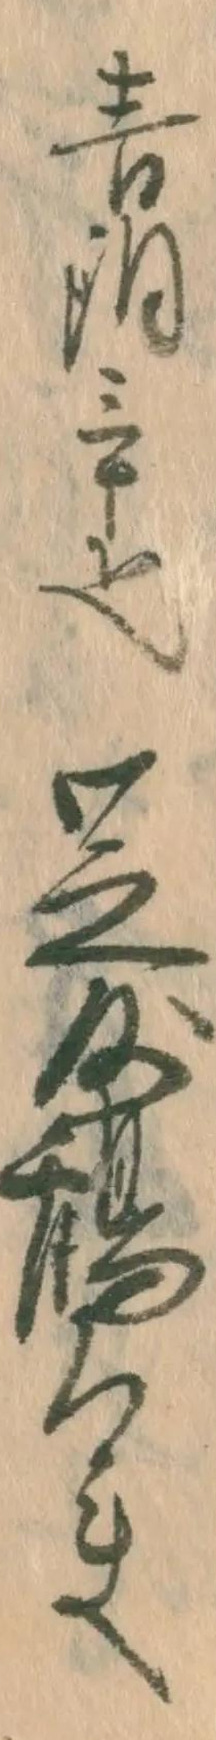青銅三十疋芝屋鶴太夫
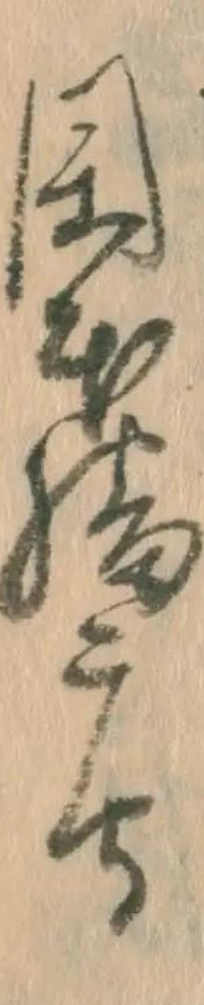岡本播磨守
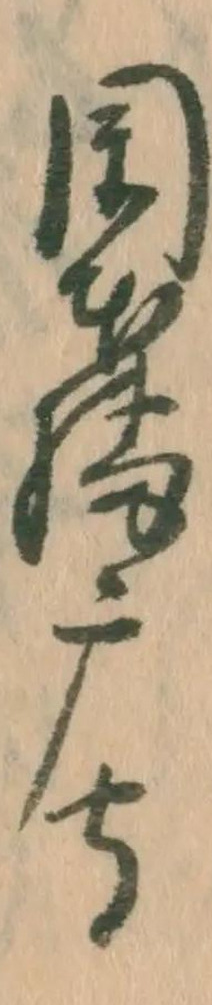岡本播磨守
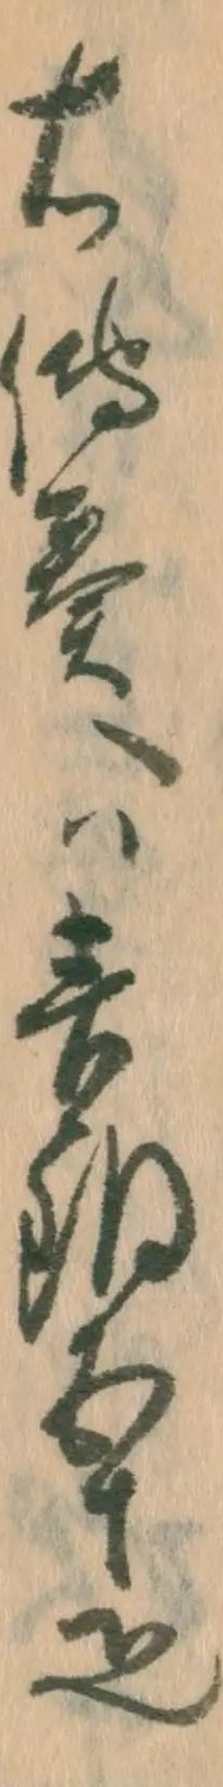右伝奏へハ青銅五十疋
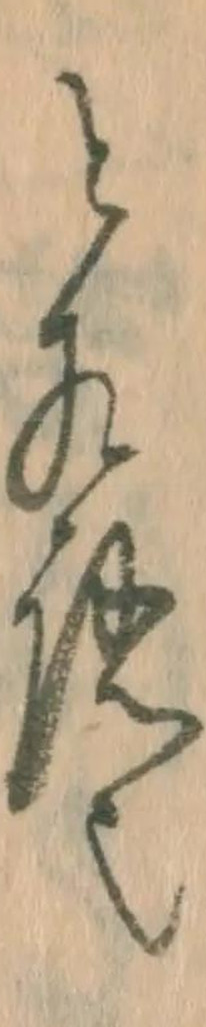と相認也
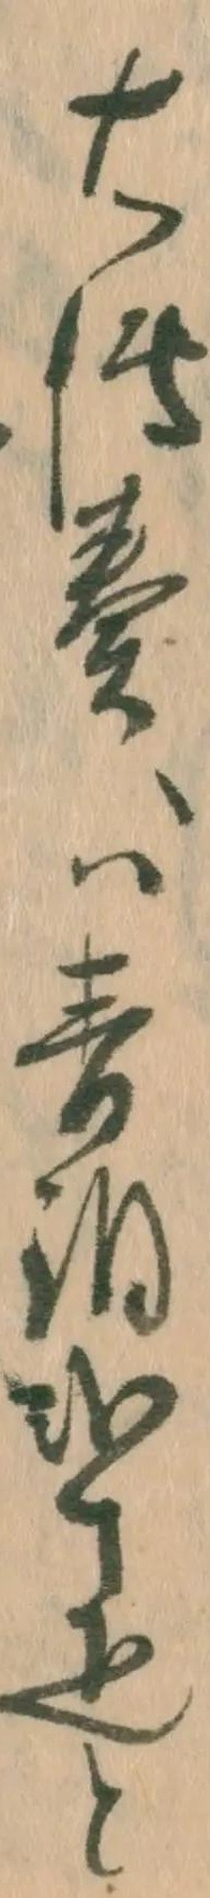右伝奏へハ青銅弐十疋と
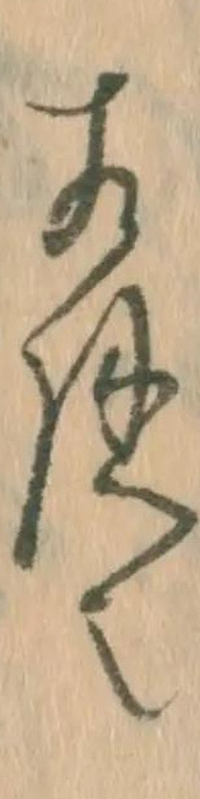相認也
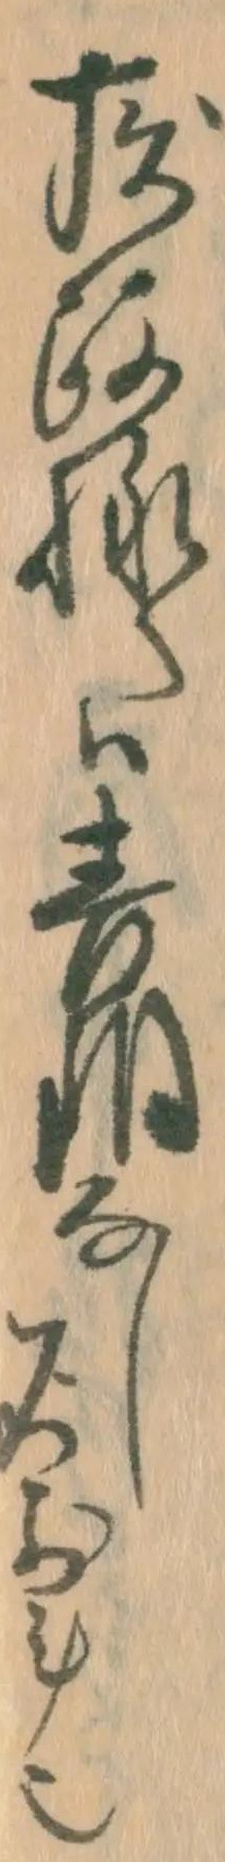摂政様へハ青銅なし名前計也
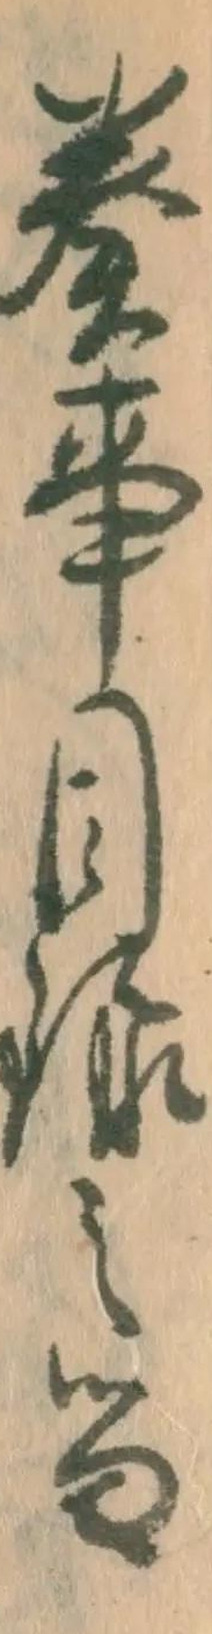奏事目録之留
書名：賀茂社記録. 第60冊
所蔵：国立国会図書館 National Diet Library, JAPAN
